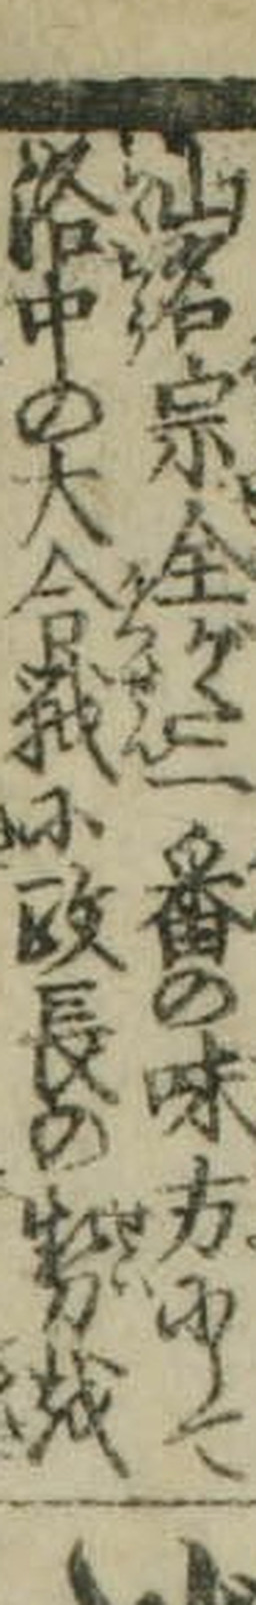洛中の大合戦に政長の勢を
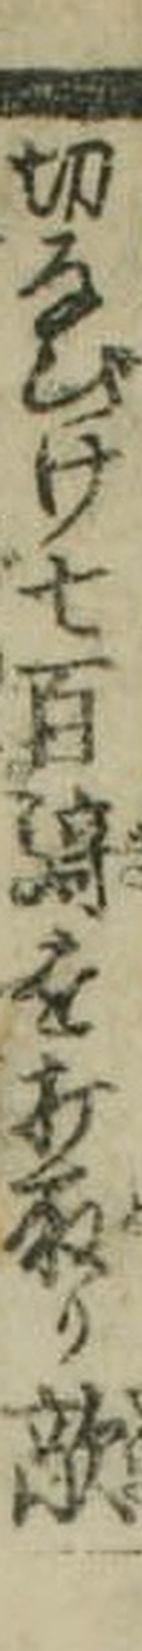切なびけ七百騎を打取り敵
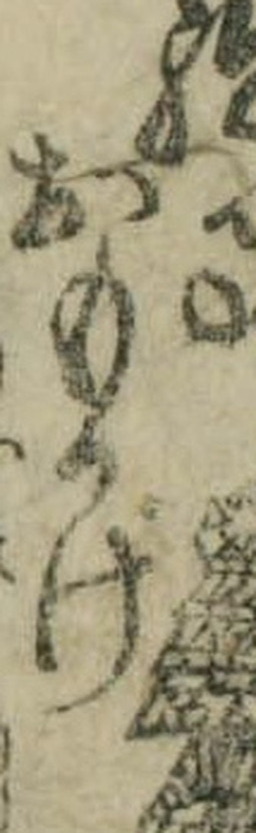おもかげ
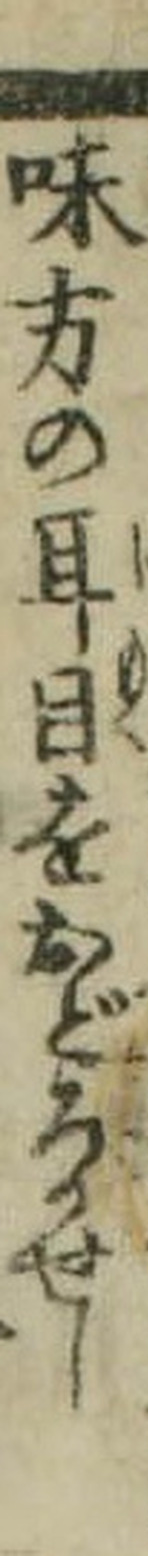味方の耳目をおどろかせし
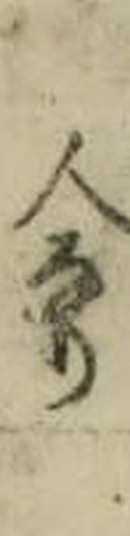人なり
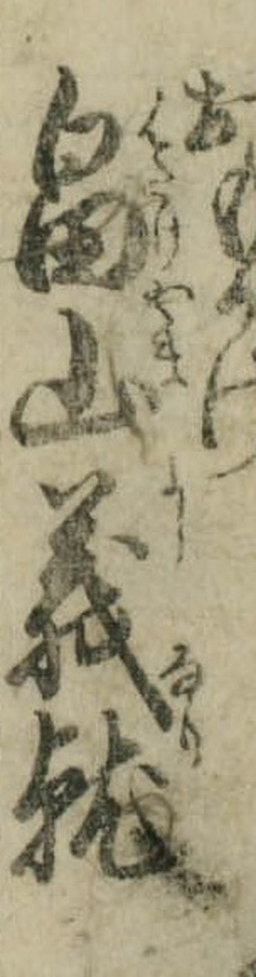畠山義就
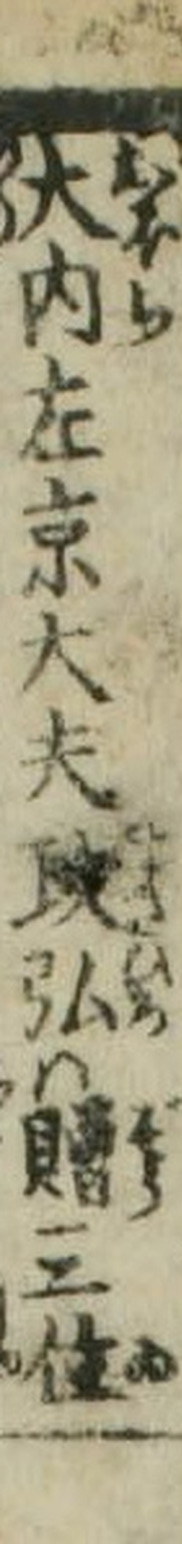大内左京大夫正弘は贈三位
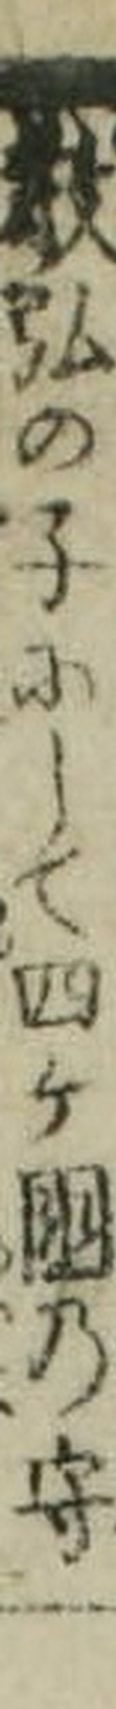教弘の子にして四ケ国の守
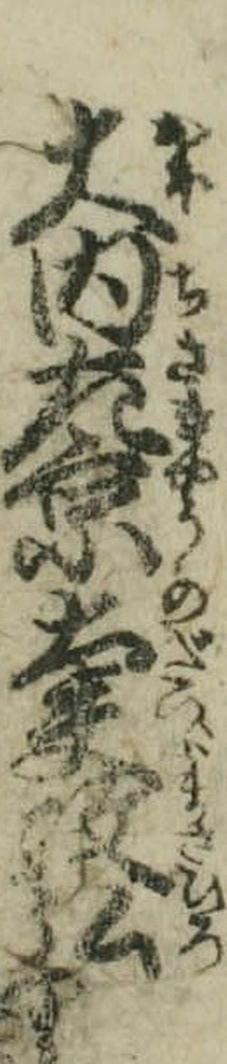大内左京大夫正弘
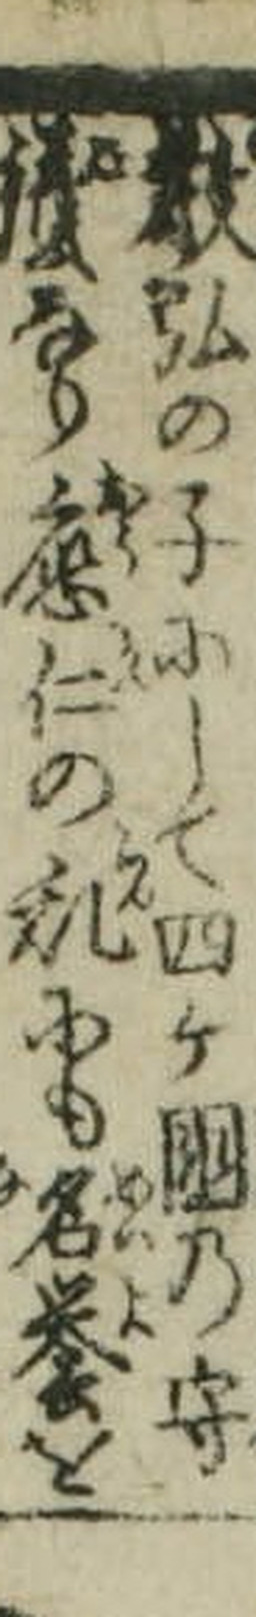護なり応仁の乱にも名誉を
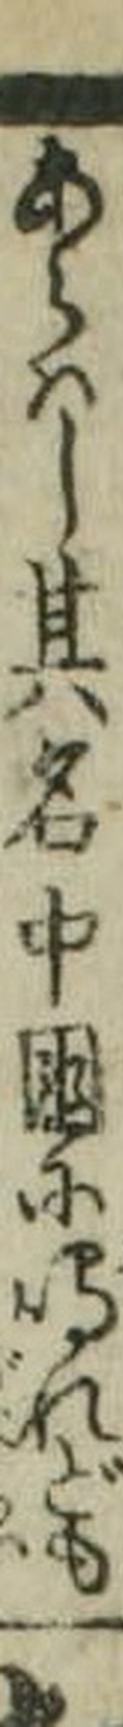あらはし其名中国に鳴れども
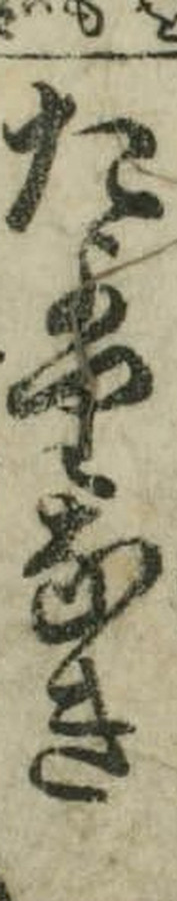たよりなき
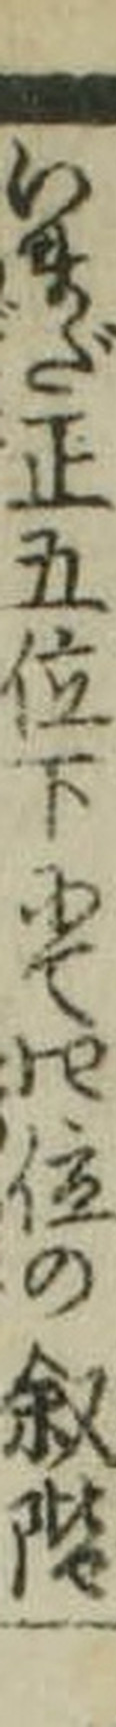いまだ正五位下にて四位の叙階
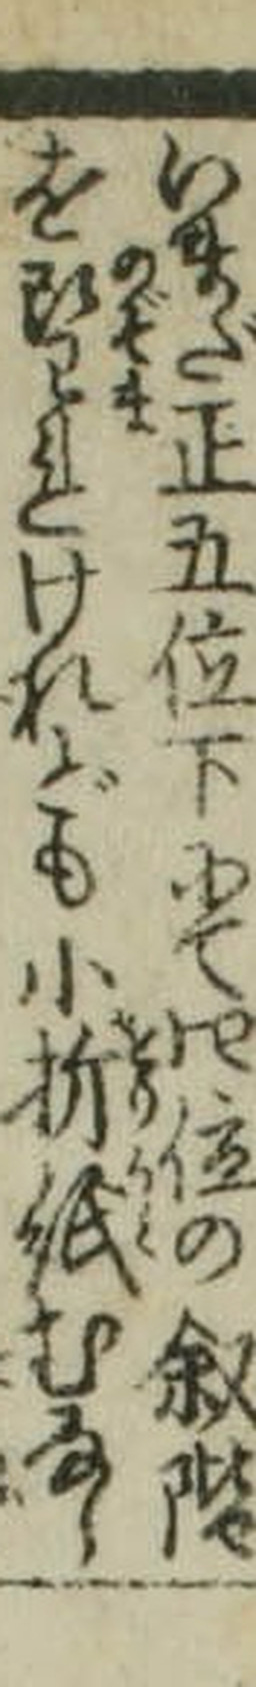を望れけれども小折紙むなし
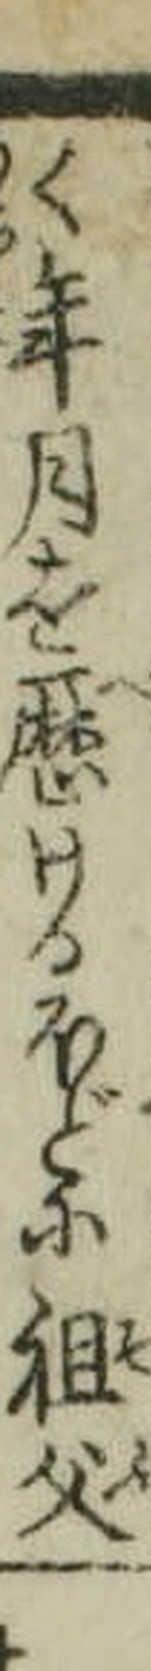く年月を歴けるほどに祖父
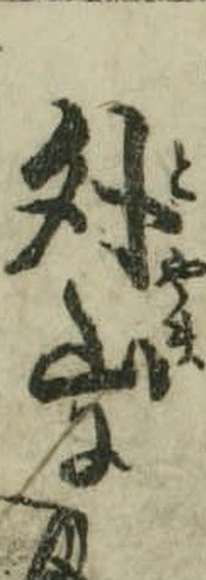外山に
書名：續英雄百人一首
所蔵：東京学芸大学附属図書館
